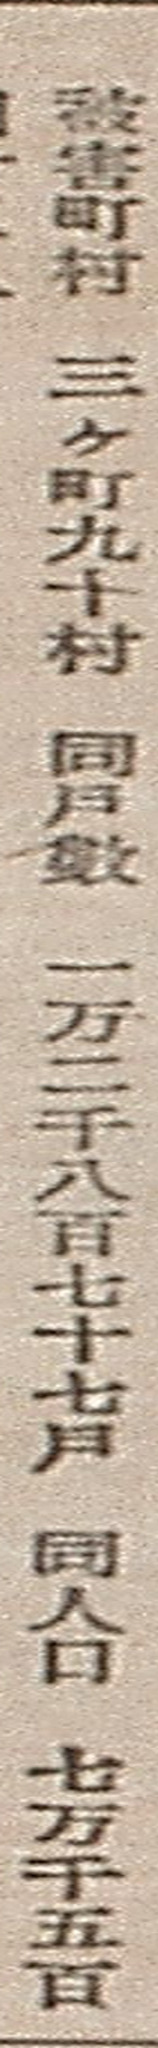被害町村三ヶ町九十村同戸数一万二千八百七十七戸同人口七万千五百
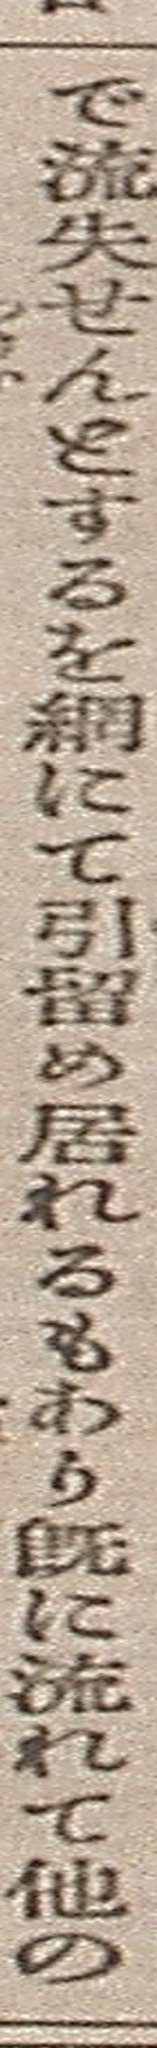で流失せんとするを綱にて引留め居れるもあり既に流れて他の
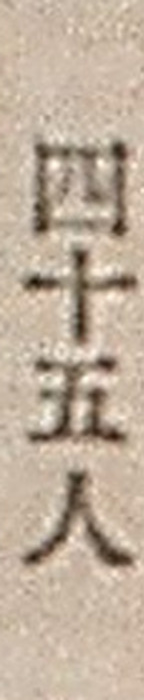四十五人
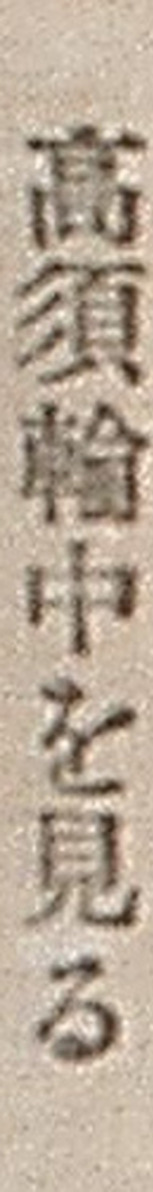高須輪中を見る
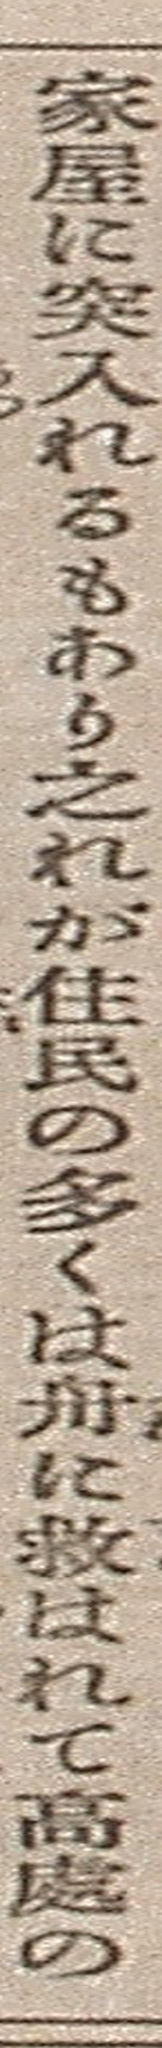家屋に突入れるもあり之れが住民の多くは舟に救はれて高処の
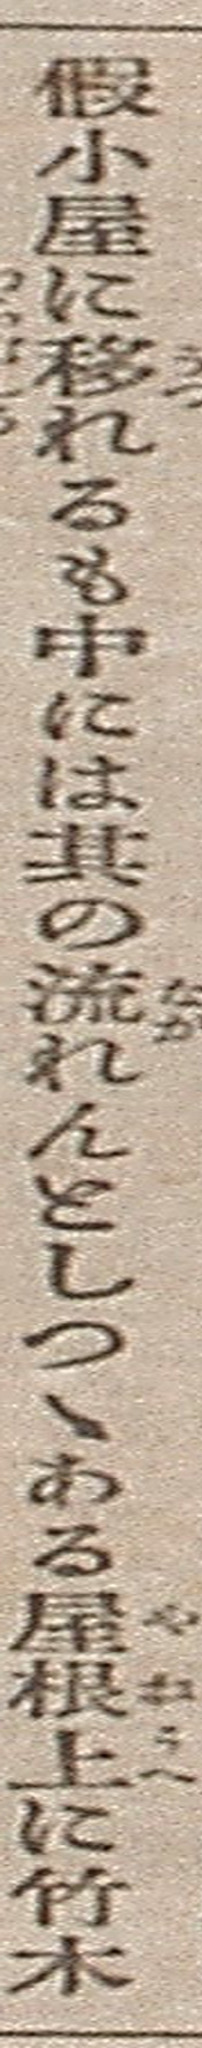仮小屋に移れるも中には其の流れんとしつゝある屋根上に竹木
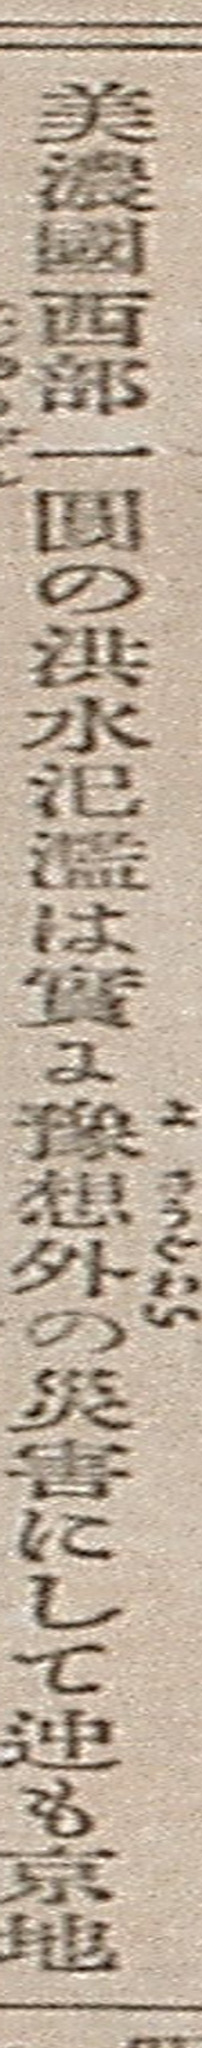美濃国西部一円の洪水氾濫は実に豫想外の災害にして迚も京地
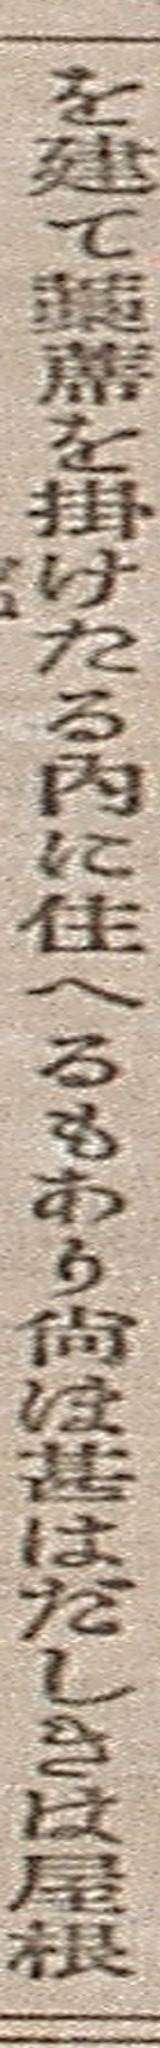を建て藁蓆を掛けたる内に住へるもあり尚ほ甚はだしきは屋根
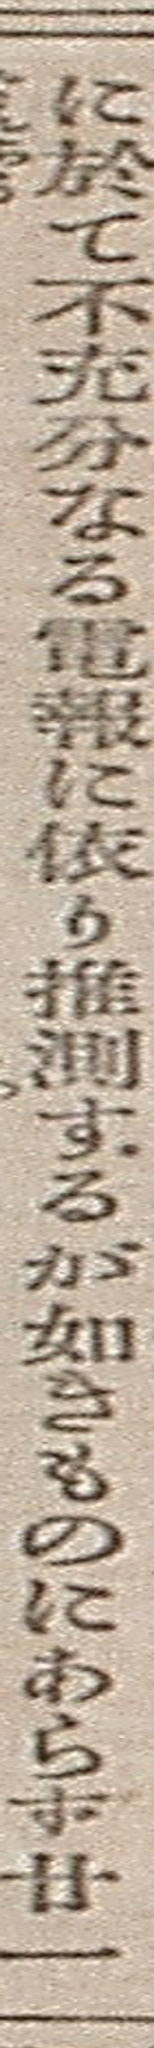に於て不充分なる電報に依り推測するが如きものにあらず廿一
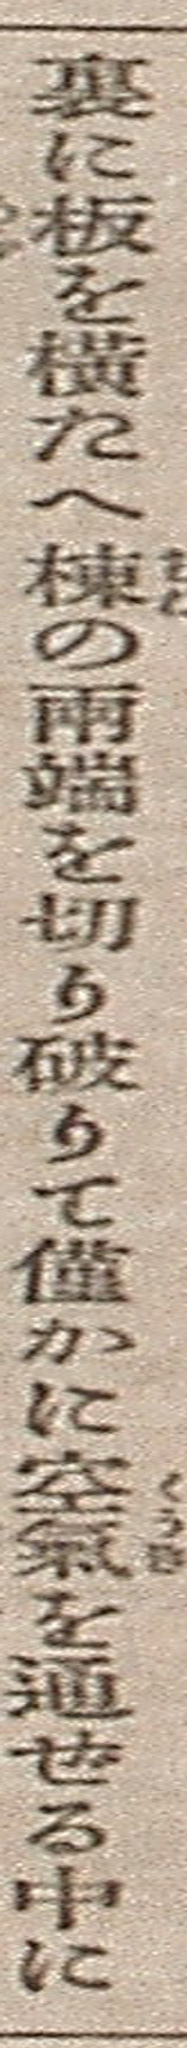裏に板を横たへ棟の両端を切り破りて僅かに空気を通ぜる中に
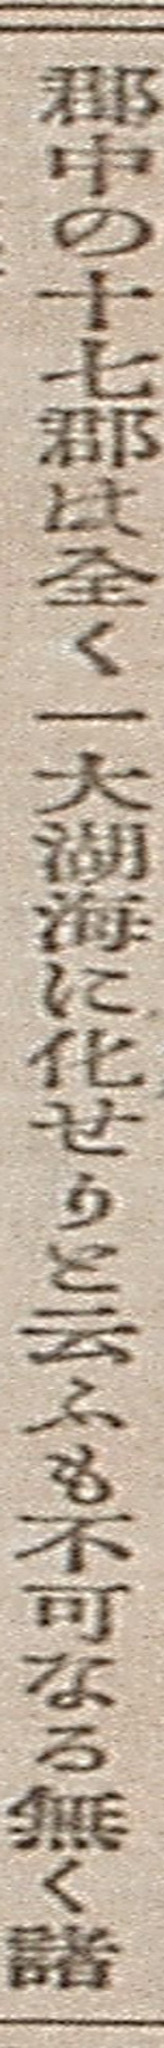郡中の十七郡は全く一大湖海に化せりと云うも不可なる無く諸
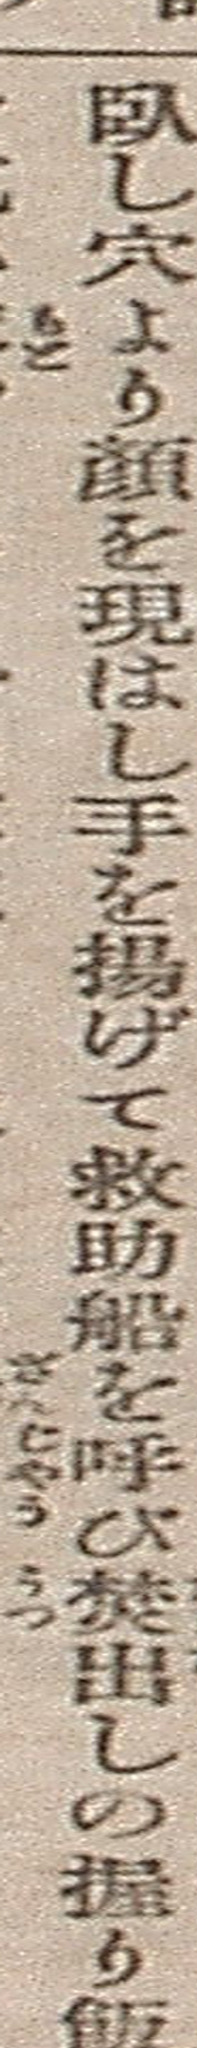臥し穴より顔を現はし手を揚げて救助船を呼び焚出しの握り飯
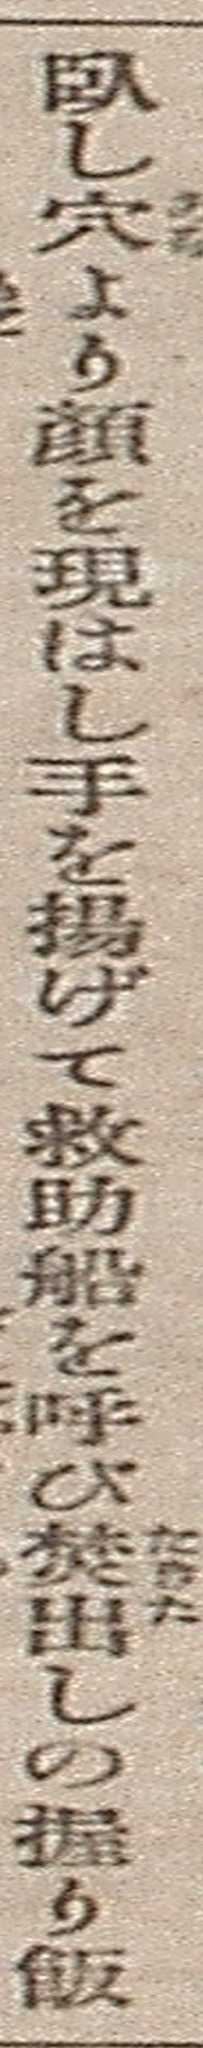臥し穴より顔を現はし手を揚げて救助船を呼び焚出しの握り飯
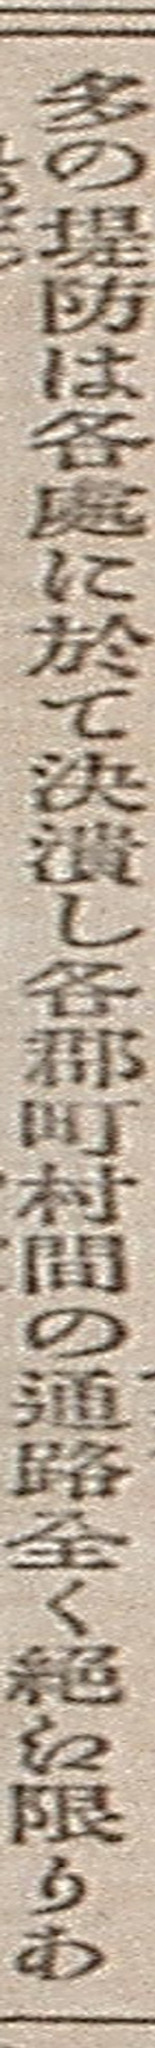多の堤防は各処に於て决潰し各郡町村間の通路全く絶江限りあ
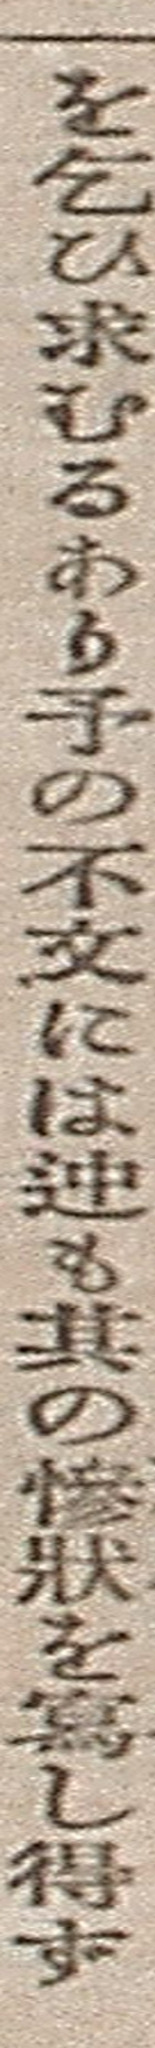を乞ひ求むるあり予の不文には迚も其の惨状を写し得ず
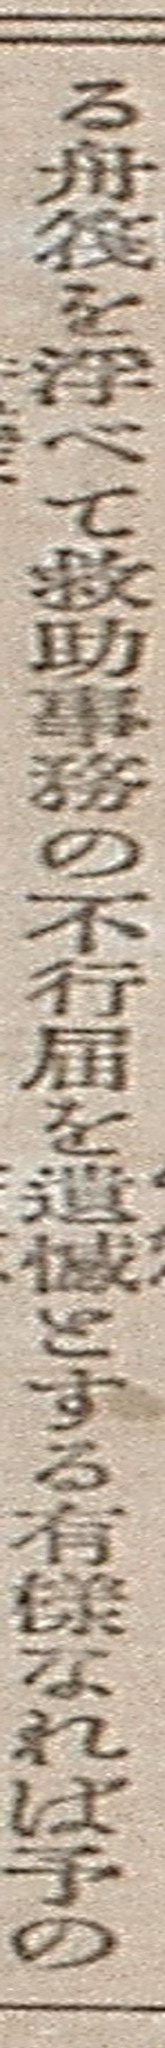る舟筏を浮べて救助事務の不行届を遺憾とする有様ならば予の
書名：風俗畫報臨時増刊第百二十六號　洪水被害録（中）
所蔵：東京大学地震研究所図書室 Earthquake Research Institute Library, The University of Tokyo, JAPAN
